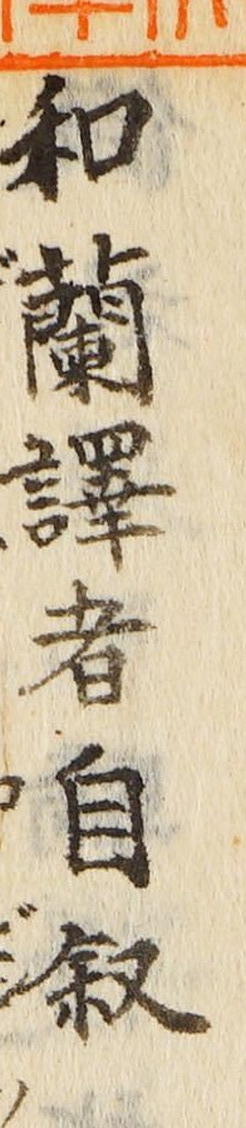和蘭訳者自叙
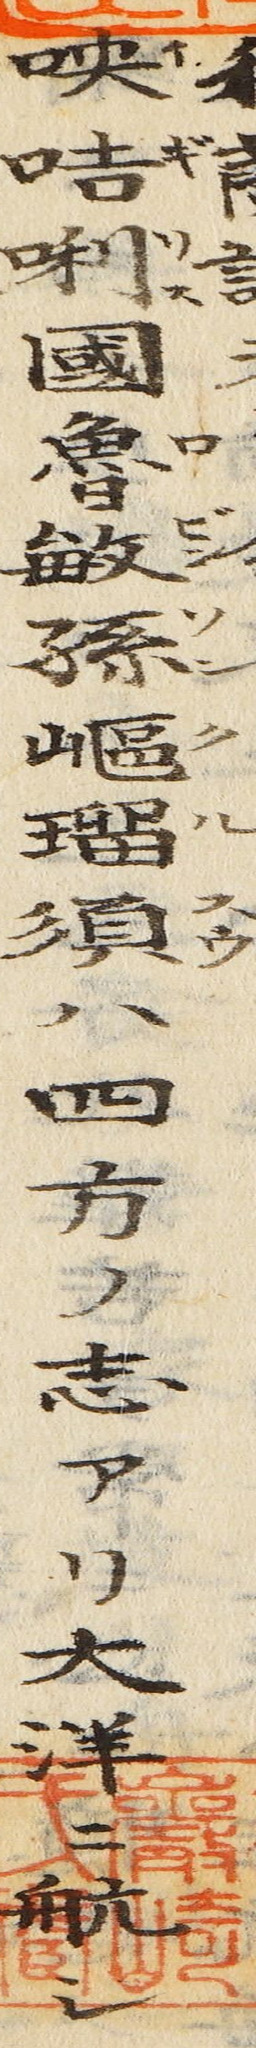咉咭唎国魯敏孫嶇瑠須ハ四方ノ志アリ大洋ニ航シ
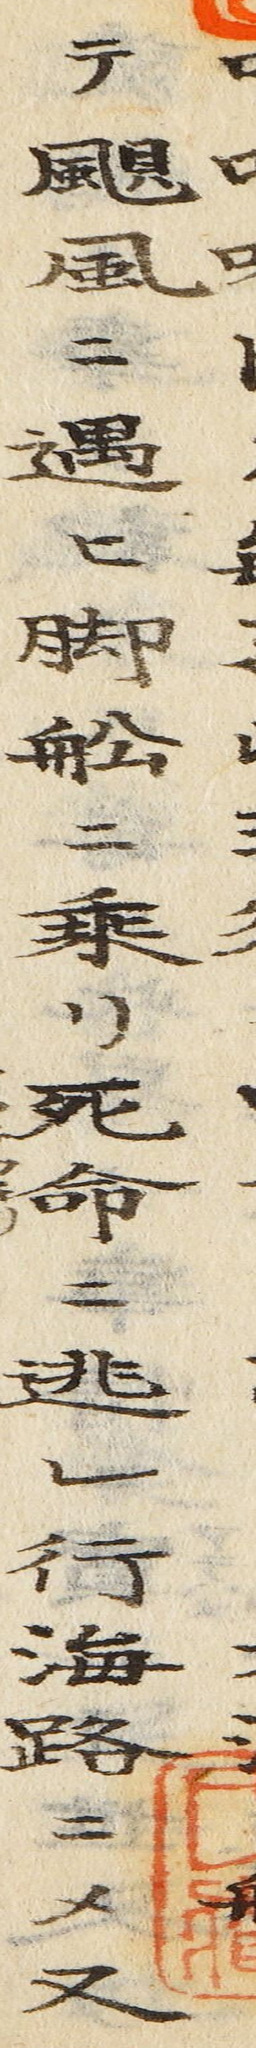テ颶風ニ遇ヒ脚船ニ乗リ死命ニ逃レ行海路ニシテ又
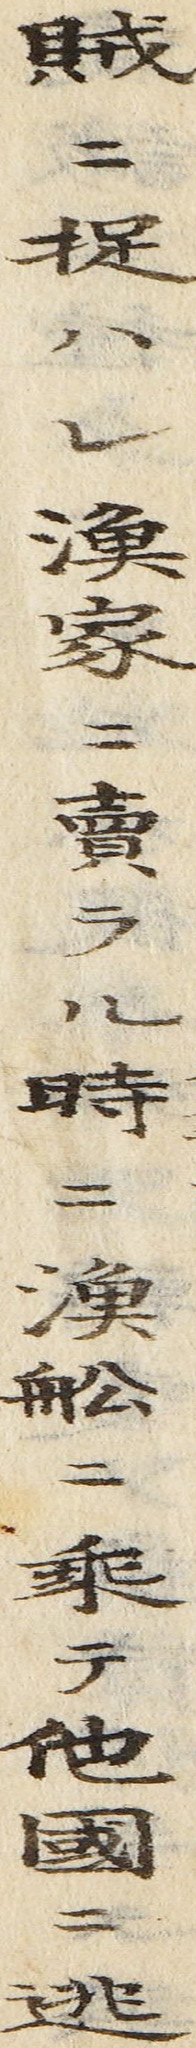賊ニ捉ハレ漁家ニ売ラル時ニ漁船ニ乗テ他国ニ逃
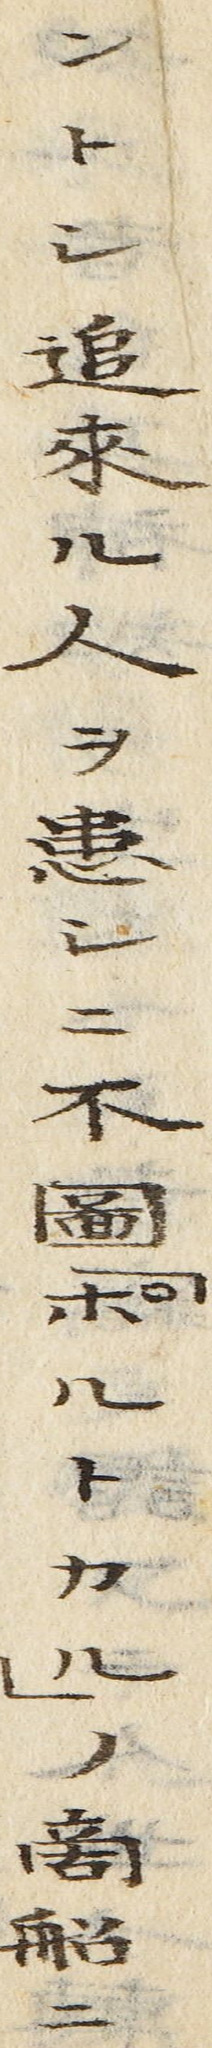ントシ追来ル人ヲ患シニ不図「ポルトカル」ノ商船ニ
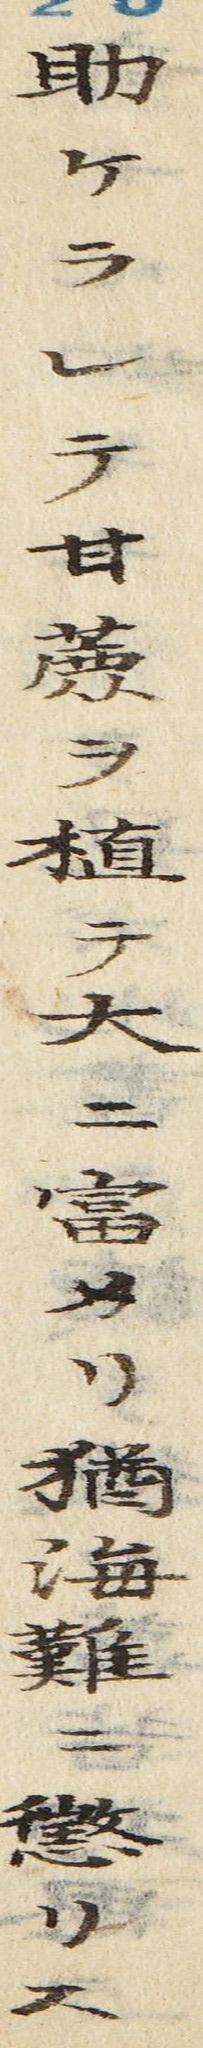助ケラレテ甘蔗ヲ植テ大ニ富メリ猶海難ニ懲リス
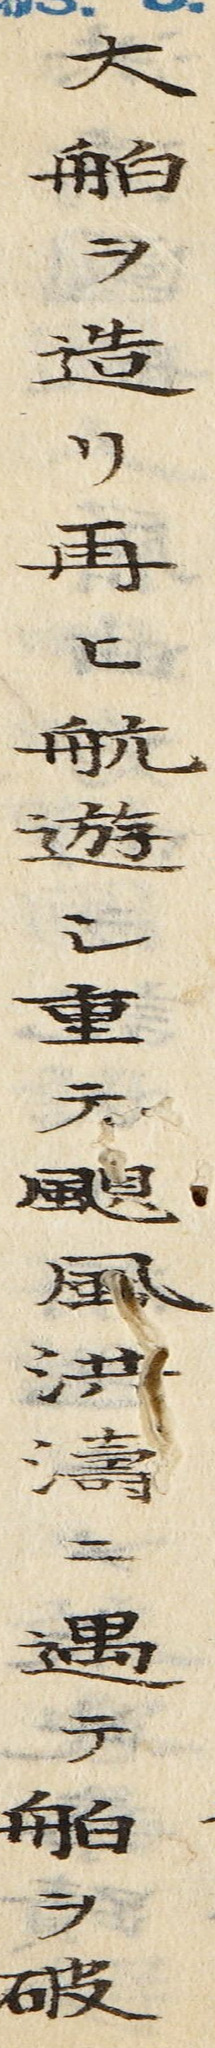大舶ヲ造リ再ヒ航遊シ重テ颶風洪涛ニ遇テ舶ヲ破
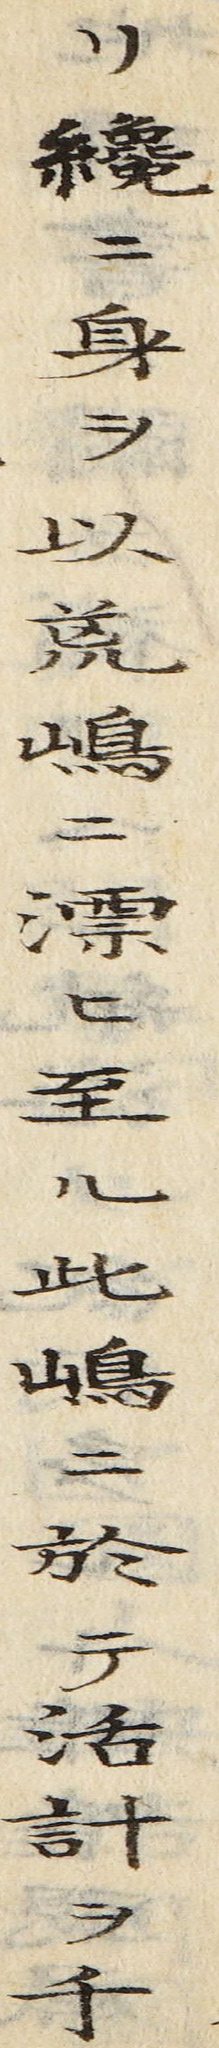リ纔ニ身ヲ以荒島ニ漂ヒ至ル此島ニ於テ活計ヲ千
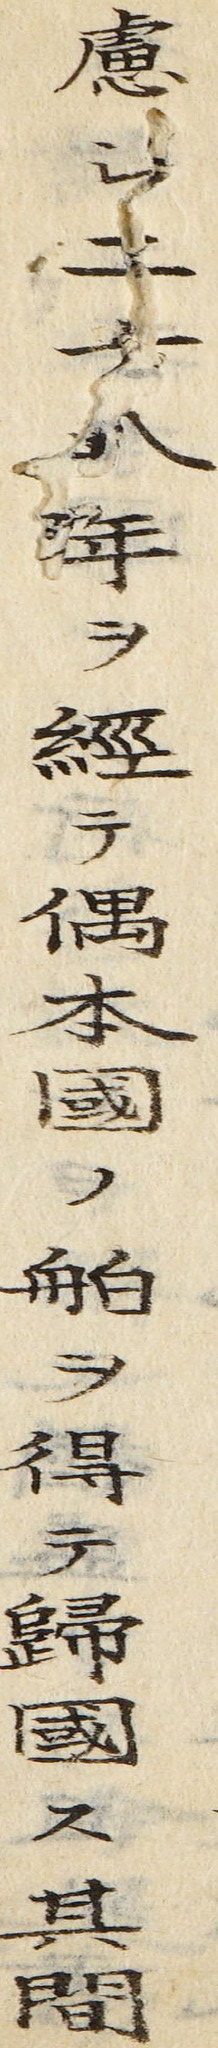慮シ二十八年ヲ経テ偶本国ノ舶ヲ得テ帰国ス其間
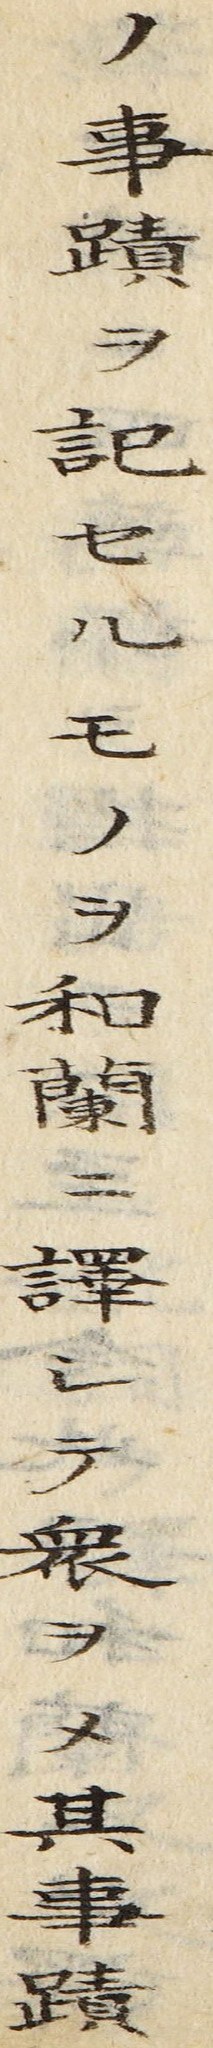ノ事蹟ヲ記セルモノヲ和蘭ニ訳シテ衆ヲシテ其事蹟
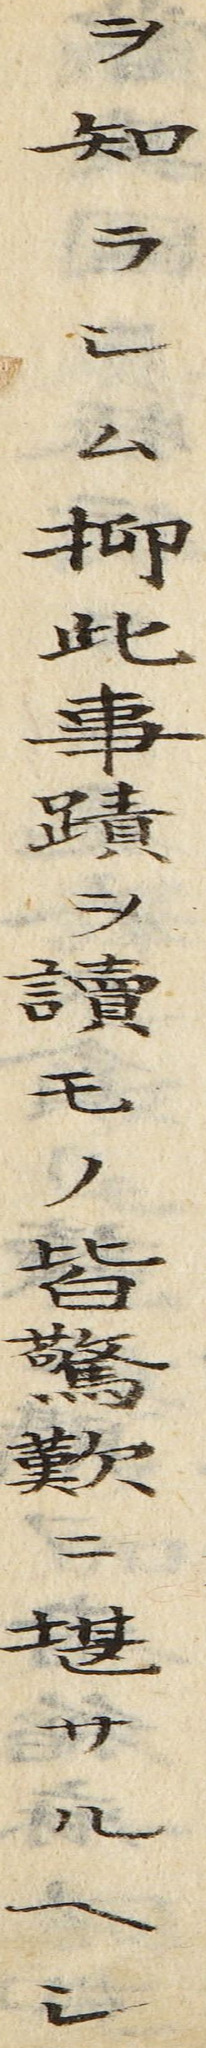ヲ知ラシム抑此事蹟ヲ読モノ皆驚歎ニ堪サルヘシ

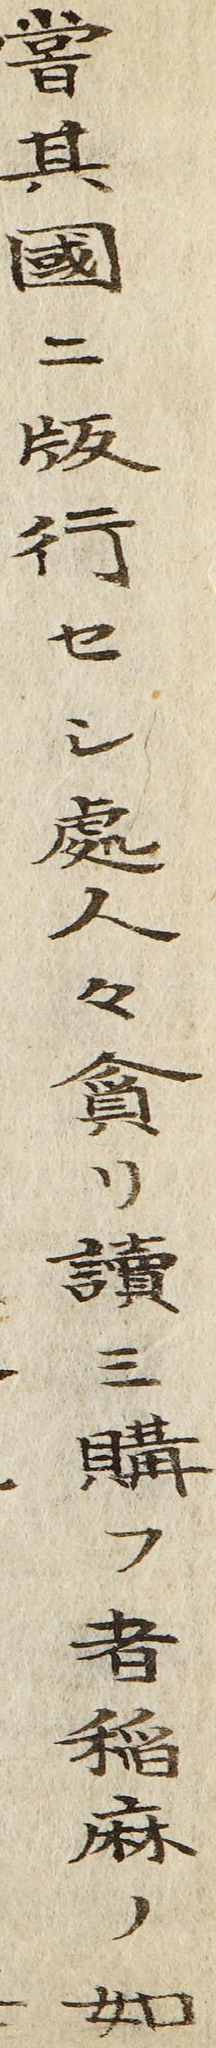嘗其国ニ版行セシ処人々貪リ読ミ購フ者稲麻ノ如
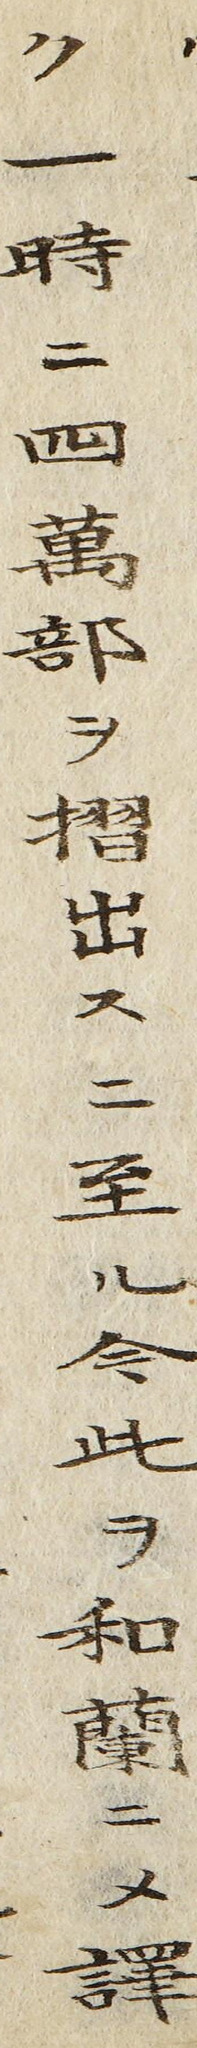ク一時ニ四万部ヲ摺出スニ至ル今此ヲ和蘭ニシテ訳
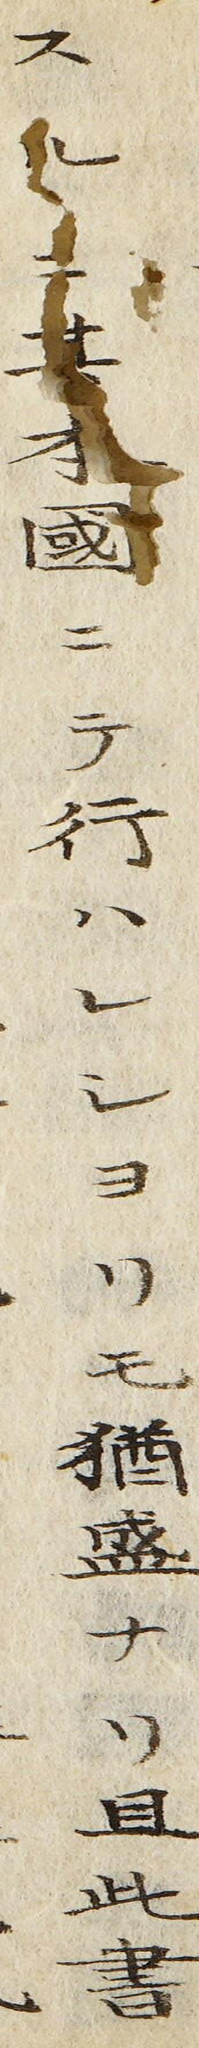スルニ其本国ニテ行ハレシヨリモ猶盛ナリ且此書
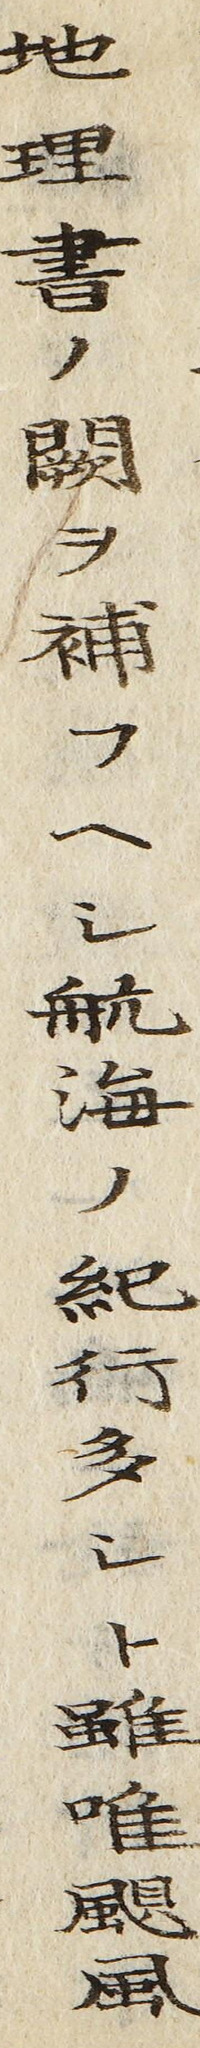地理書ノ闕ヲ補フヘシ航海ノ紀行多シト雖唯颶風
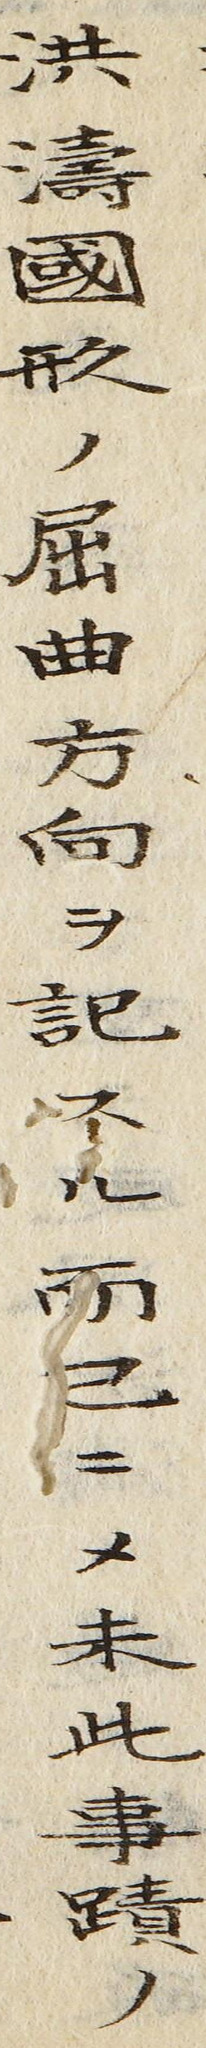洪涛国形ノ屈曲方向ヲ記スル而已ニシテ未此事蹟ノ
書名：漂流紀事
